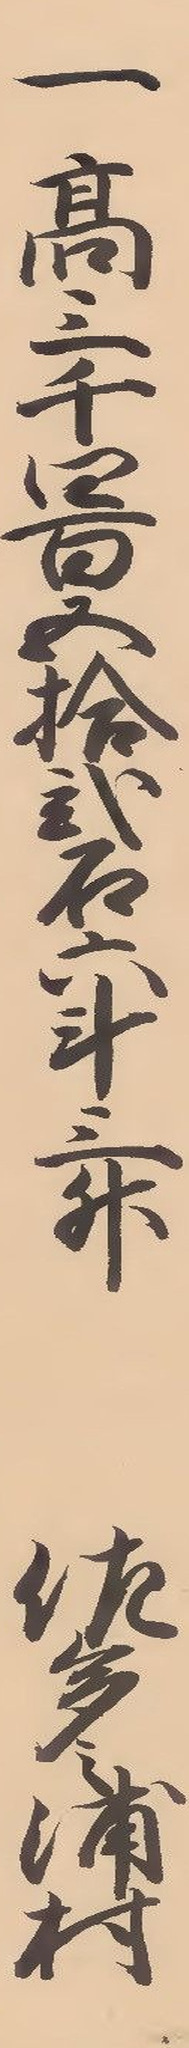一高三千四百五拾弐石六斗三升佐多之浦村
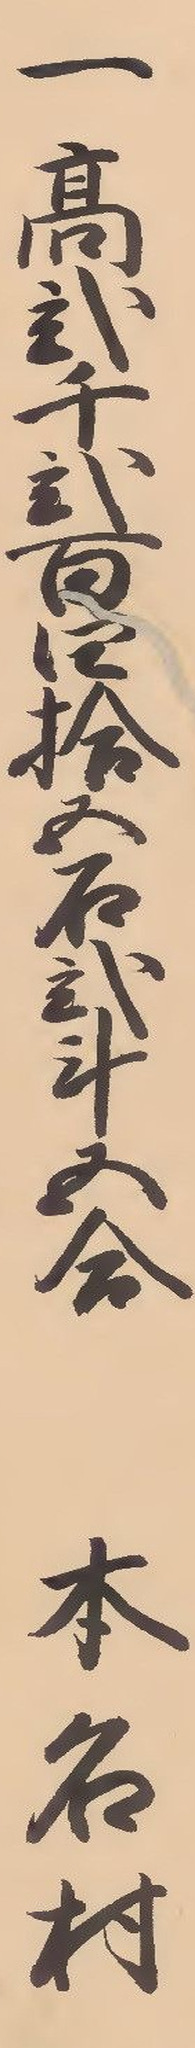一高弐千弐百四拾五石弐斗五合本名村

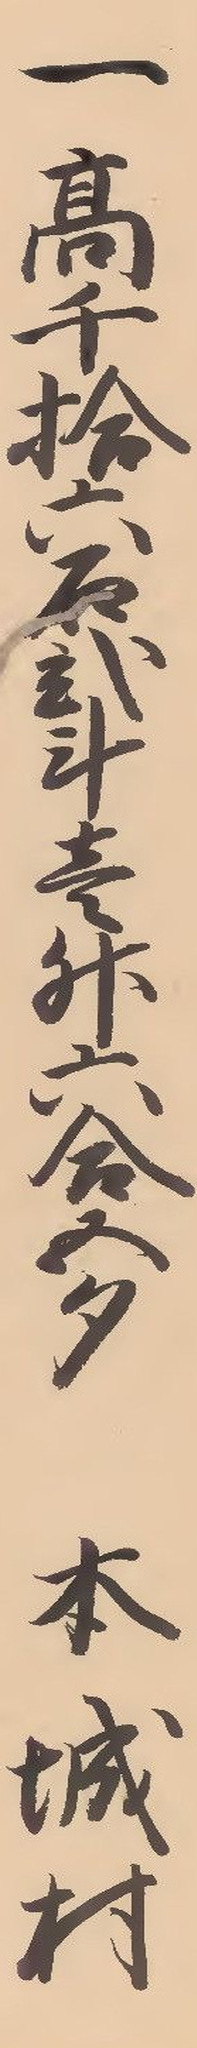一高千拾六石弐斗壱升六合五勺本城村
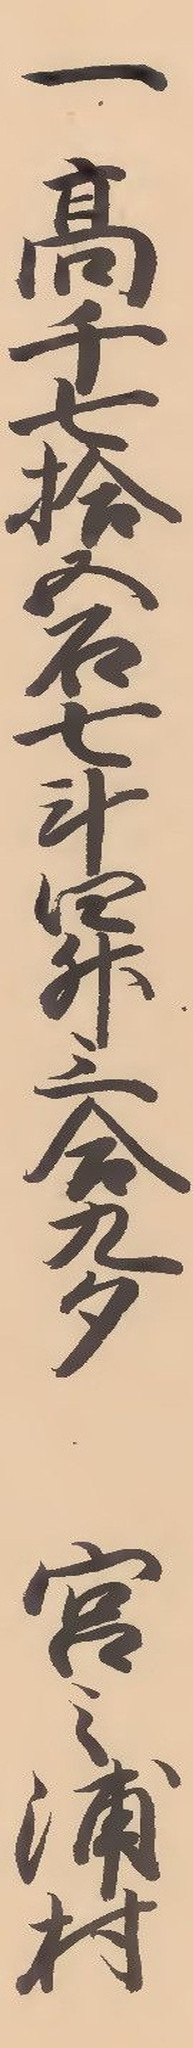一高千七拾五石七斗四升三合九勺宮之浦村
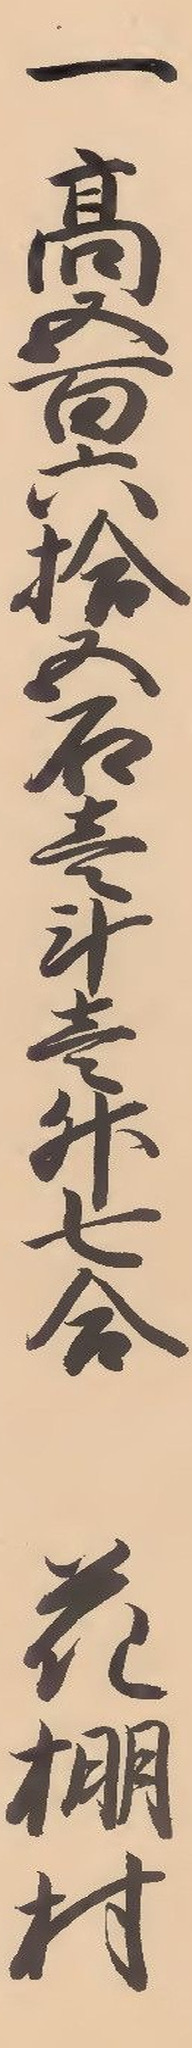一高五百六拾五石壱斗壱升七合花棚村
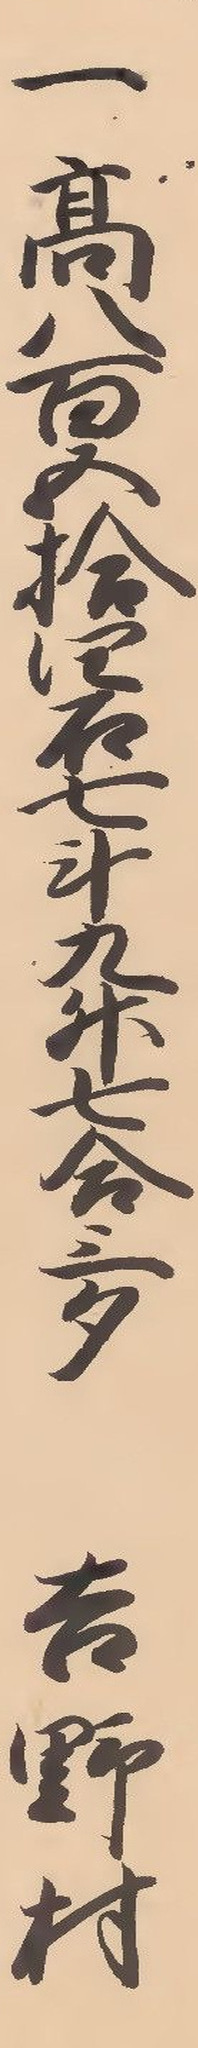一高八百五拾四石七斗九升七合三勺吉野村
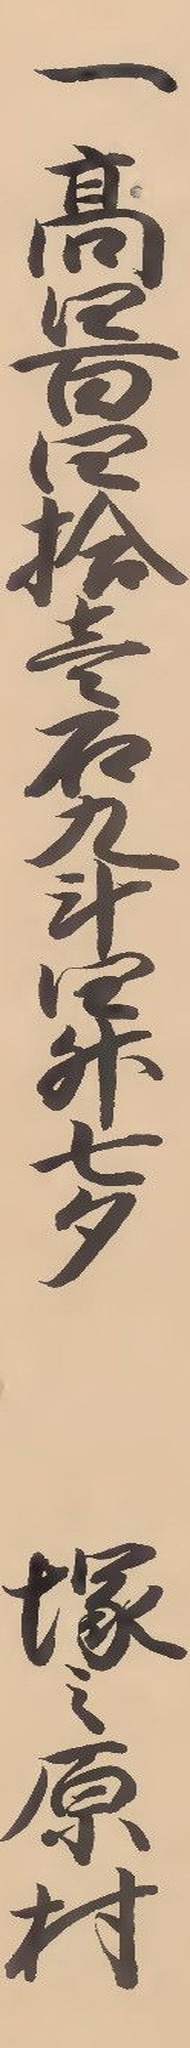一高四百四拾壱石九斗四升七勺塚ノ原村
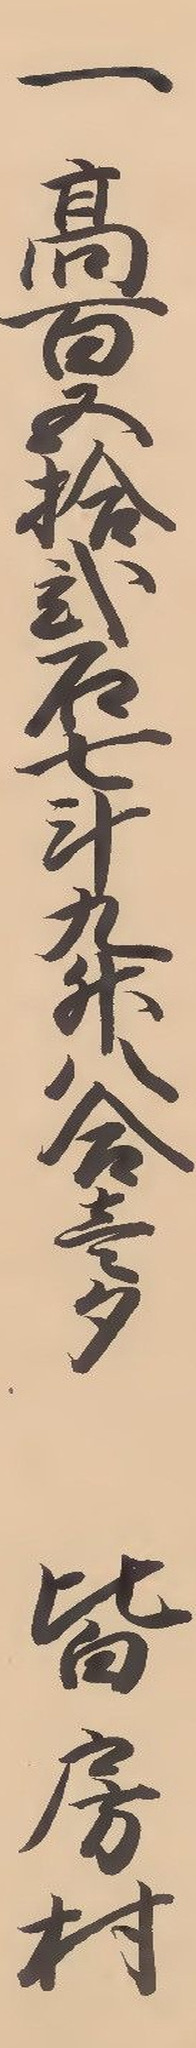一高百五拾弐石七斗九升八合壱勺皆房村
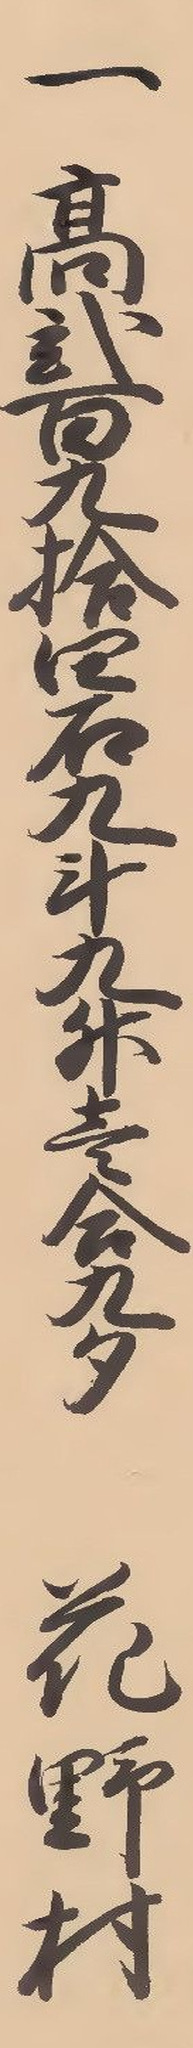一高弐百九拾四石九斗九升壱合九勺花野村
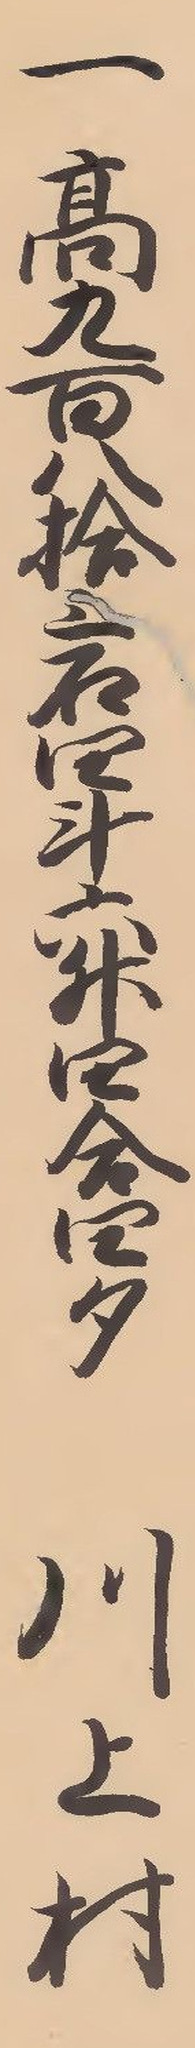一高九百八拾三石四斗六升四合四勺川上村

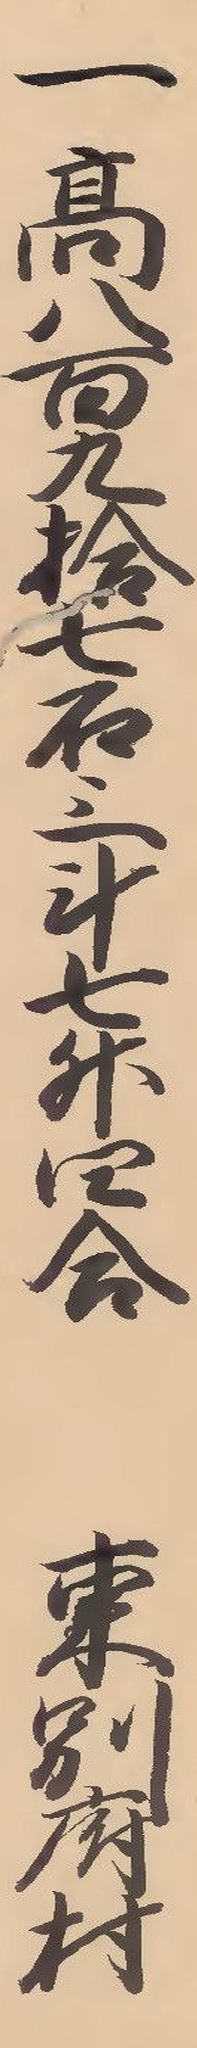一高八百九拾七石三斗七升四合東別府村
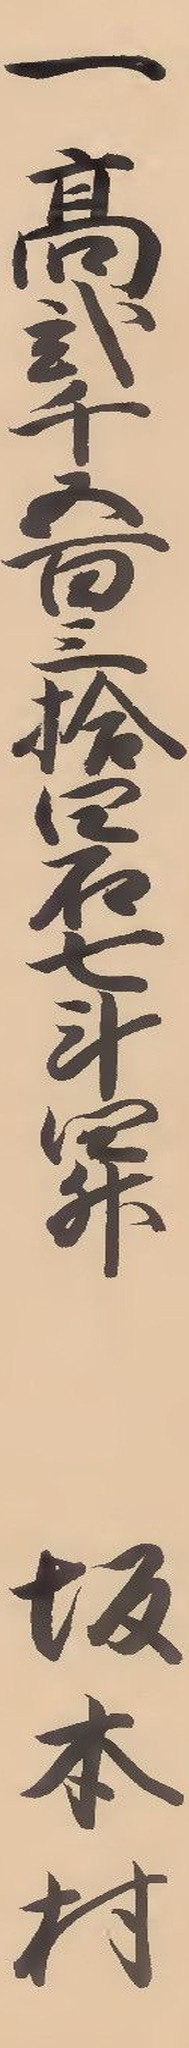一高弐千五百三拾四石七斗四升坂本村
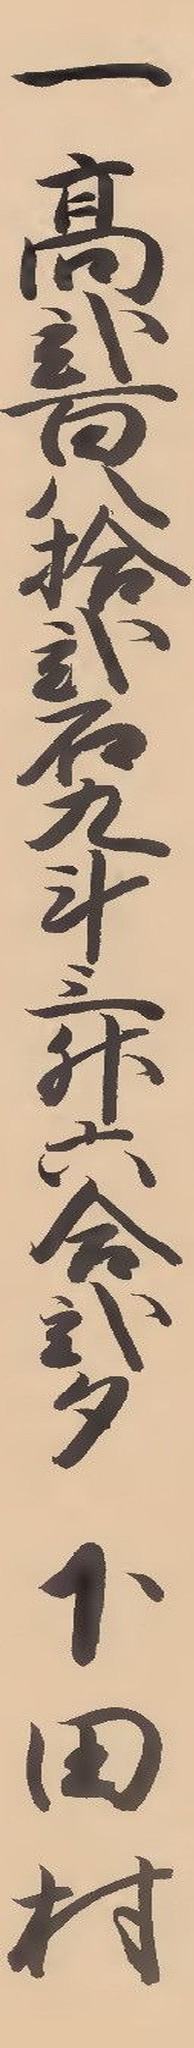一高弐百八拾弐石九斗三升六合弐勺下田村
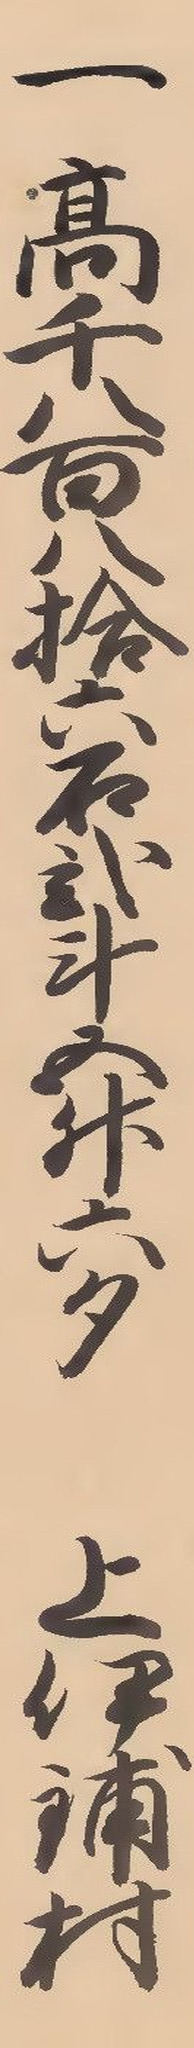一高千八百八拾六石弐斗五升六勺上伊鋪村
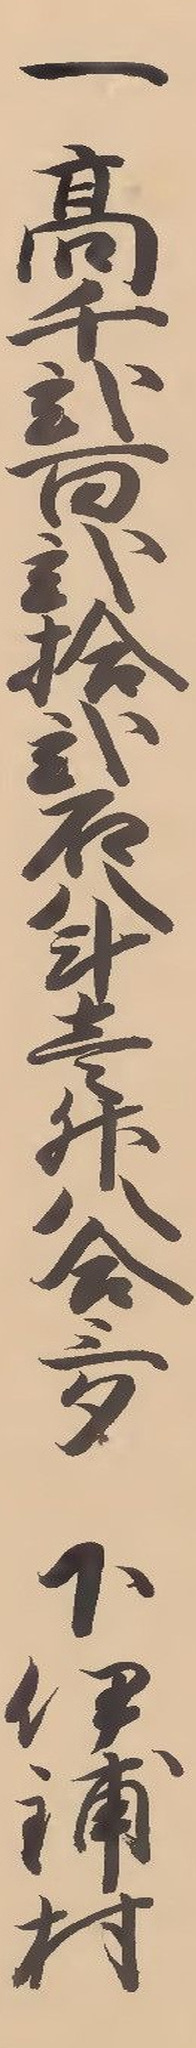一高千弐百弐拾弐石八斗壱升八合三勺下伊鋪村
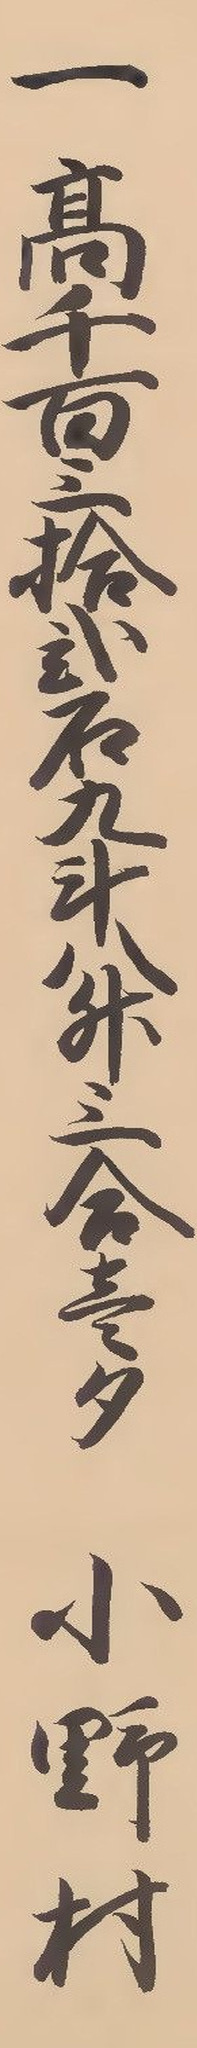一高千百三拾弐石九斗八升三合壱勺小野村
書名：薩摩国郷帳
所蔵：国立公文書館 National Archives of Japan
